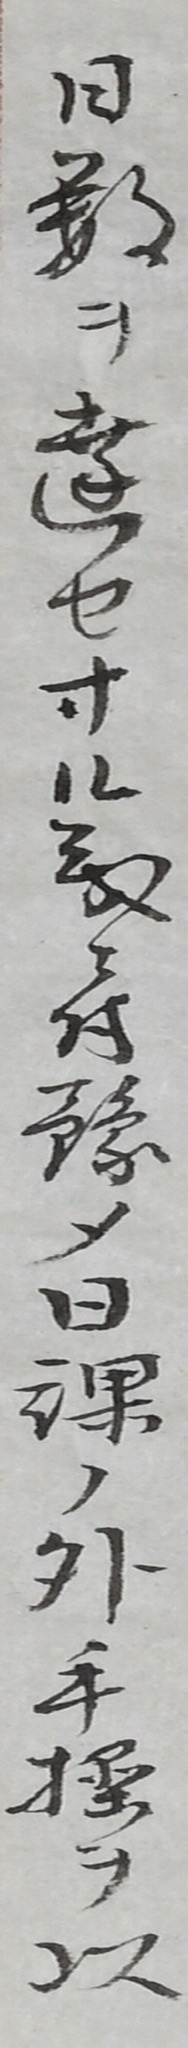日数ヲ達セサル義ニ付予メ日課ノ外手操ヲ以
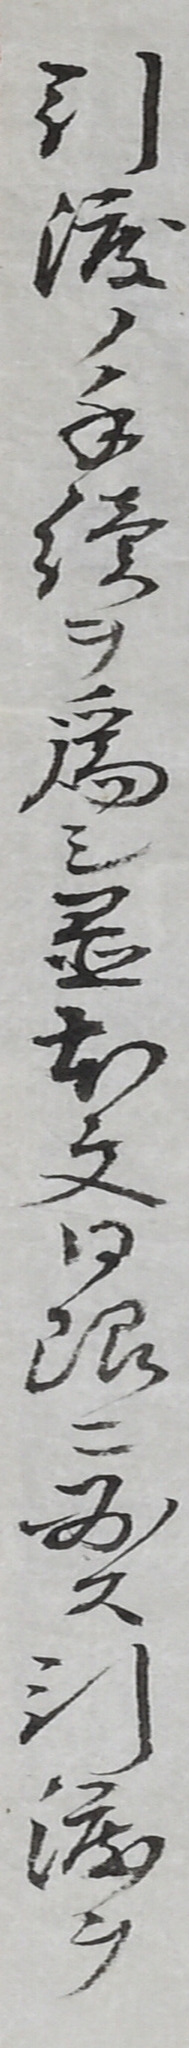引渡ノ手続ヲ為シ置本文日限ニ必ス引渡ヲ
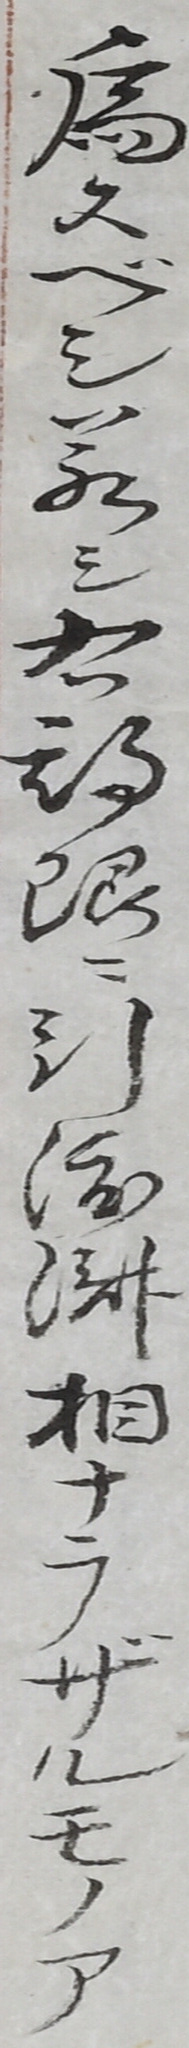為スベシ若シ右期限ニ引渡済相ナラザルモノア
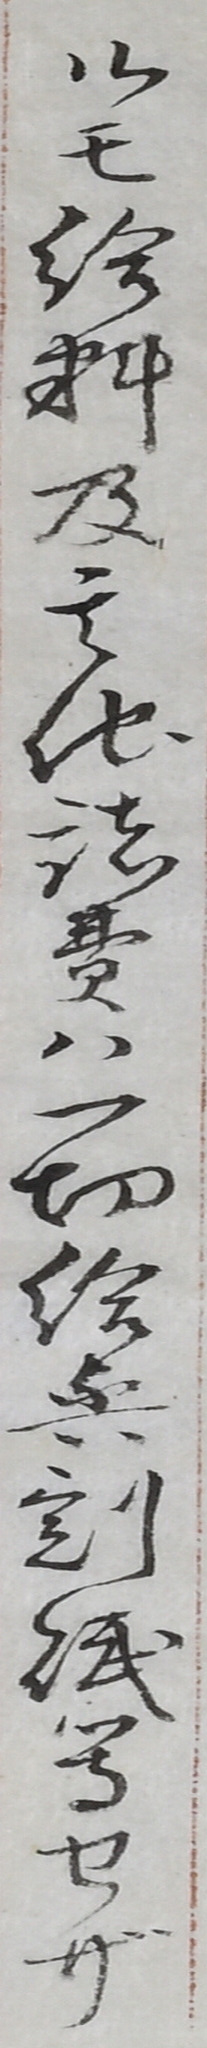ルモ給料及其他諸費ハ一切給与割賦等セザ
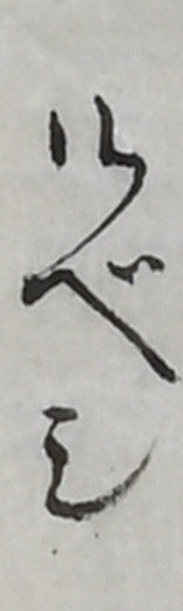ルべシ
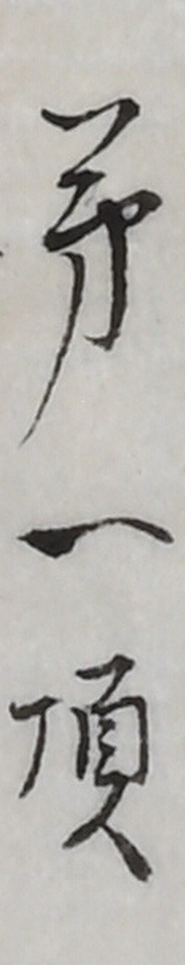第一項
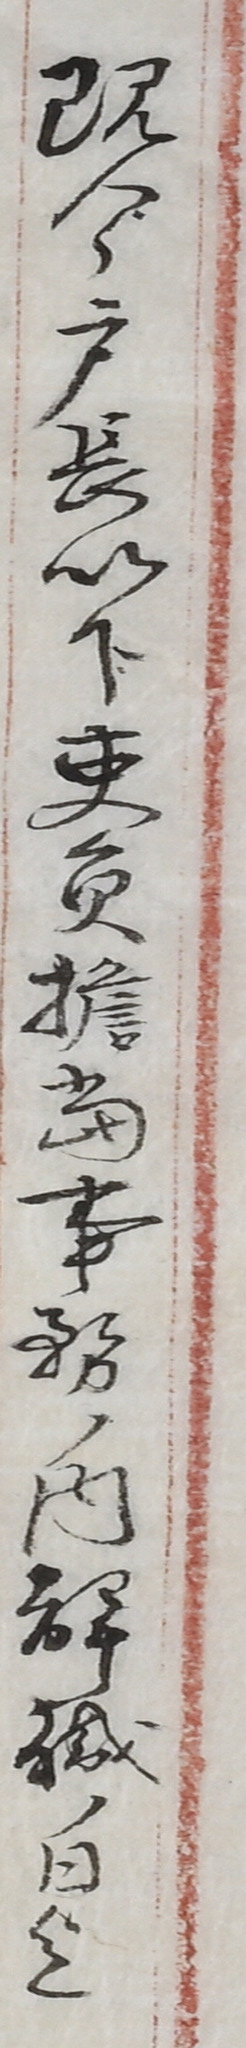現今戸長以下吏員担当事務ノ内解職ノ内迄
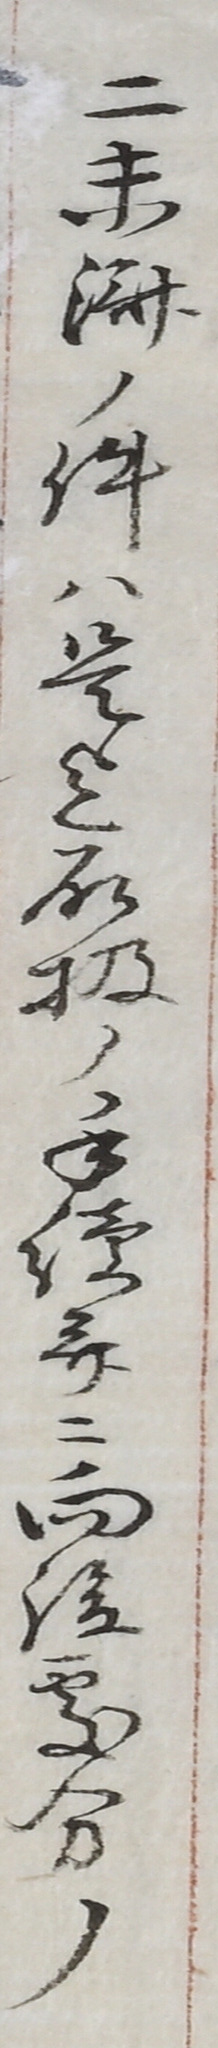ニ未済ノ件ハ是迄取扱ノ手続幷ニ向後処分ノ
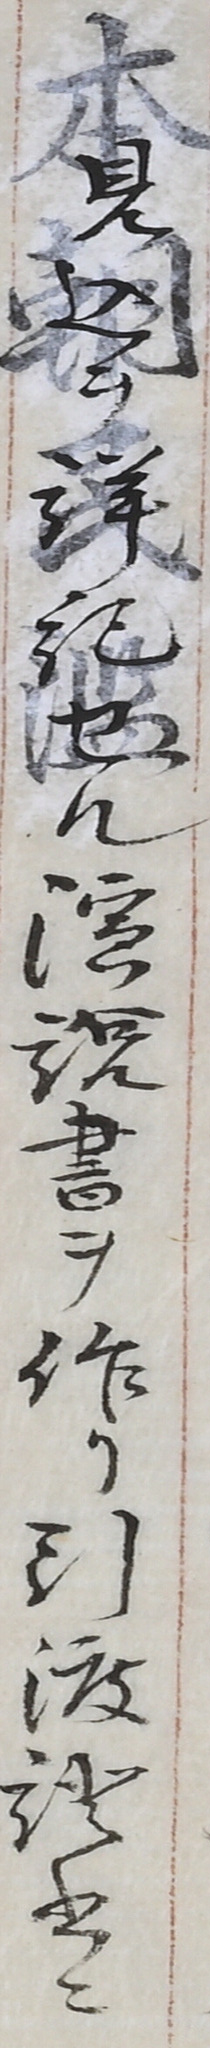見込ヲ詳記セル演説書ヲ作リ引渡証書ニ
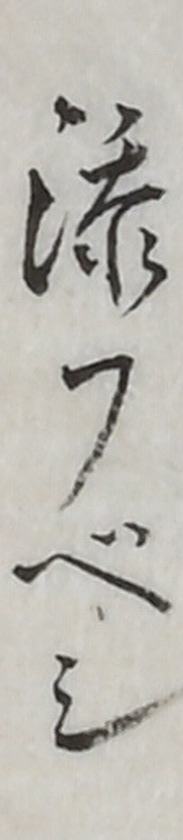添フベシ
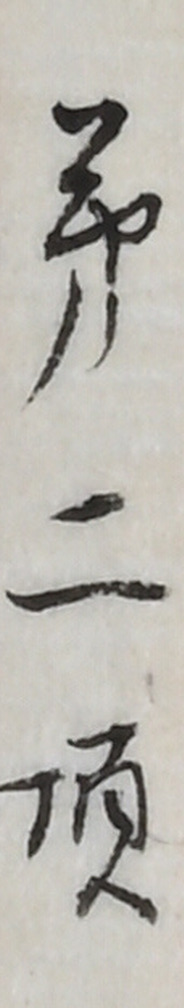第二項
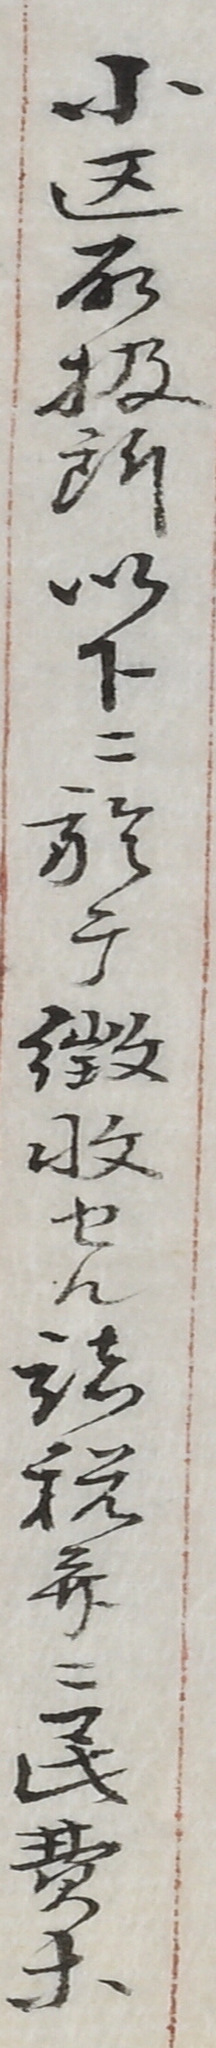小区取扱所以下ニ於テ徴収セル諸税并ニ民費等
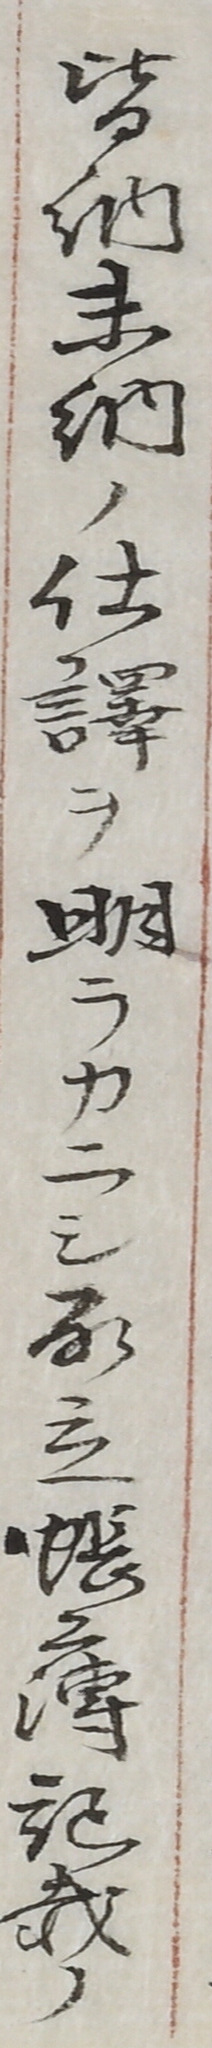皆納未納ノ仕訳ヲ明ラカニシ取立帳記載ノ
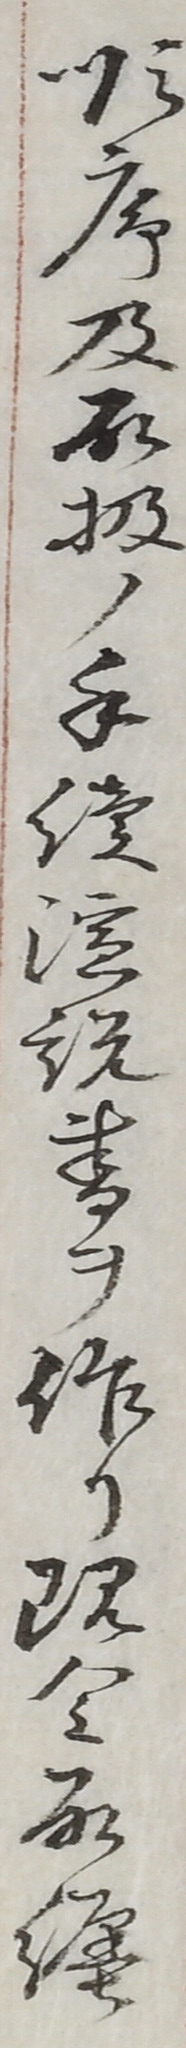順序及取扱ノ手続演説書ヲ作リ現金取纏
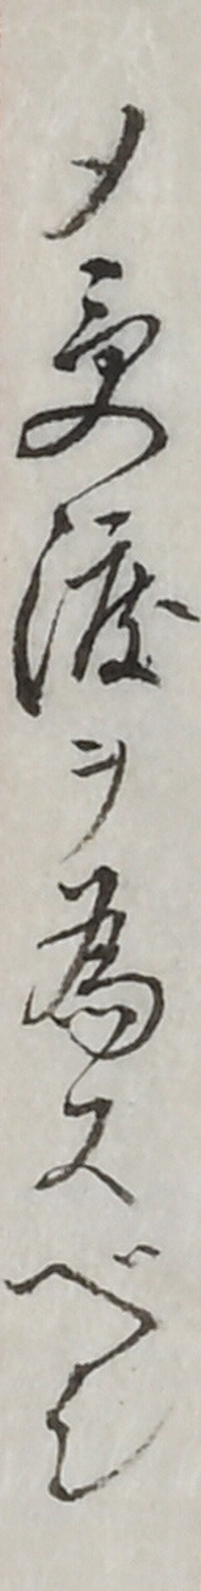メ受渡ヲ為スベシ
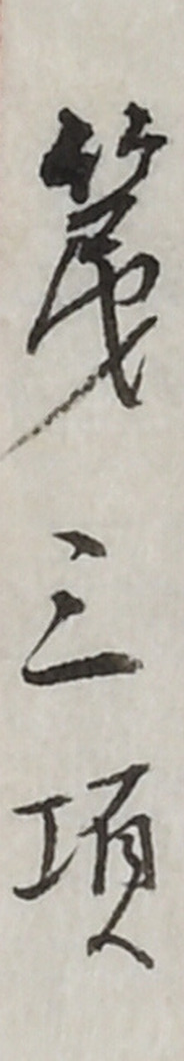第三項
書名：郡役所勤務中御用抜書
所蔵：伊那市立高遠町図書館・合同会社AMANE
